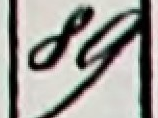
89
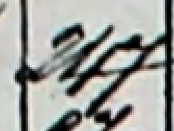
247
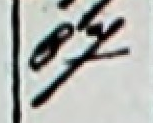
87
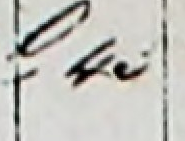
0,43
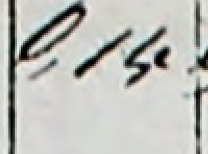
0,15
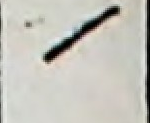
1
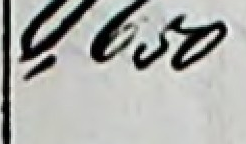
0,650
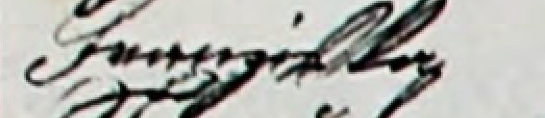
Franziska
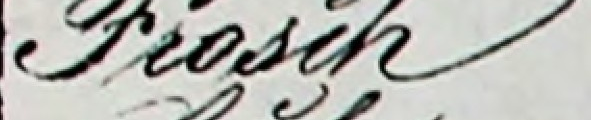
Frosch
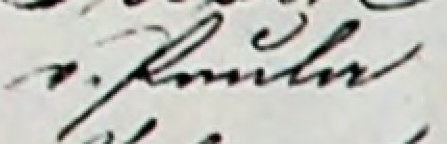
v. Paula
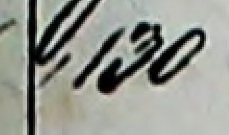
0,130
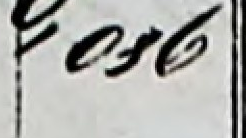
0,036
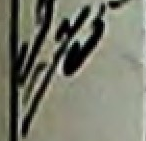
3,75
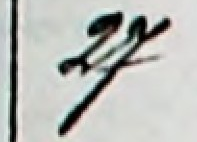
27
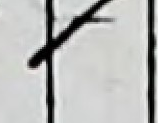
7
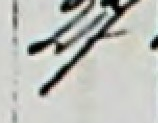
27
